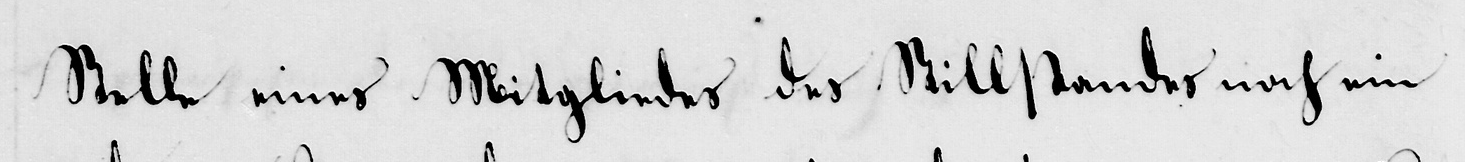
Stelle eines Mitgliedes des Stillstandes noch ein
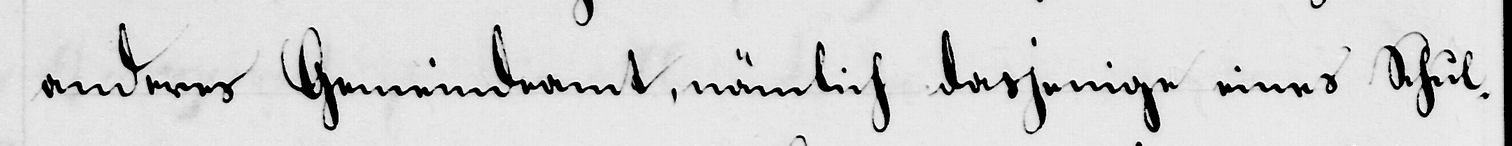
anderes Gemeindeamt, nämlich dasjenige eines Schul¬
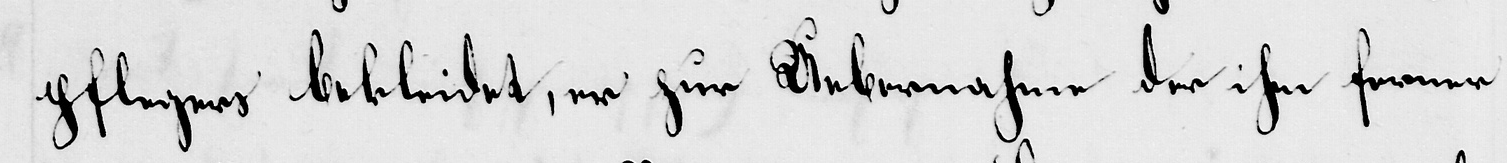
pflegers bekleidet, er zur Uebernahme der ihm ferner
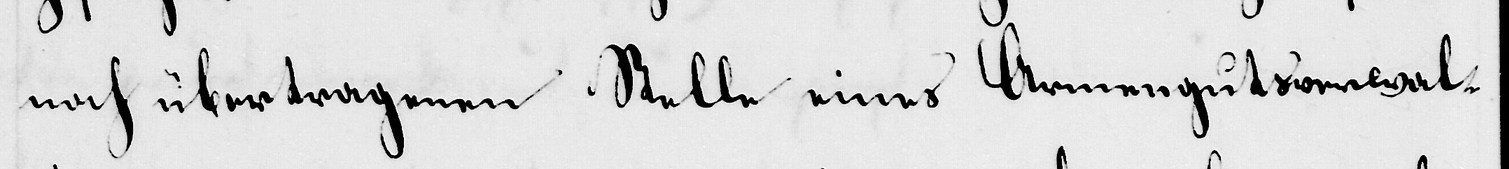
noch übertragenen Stelle eines Armengutsverwalt¬
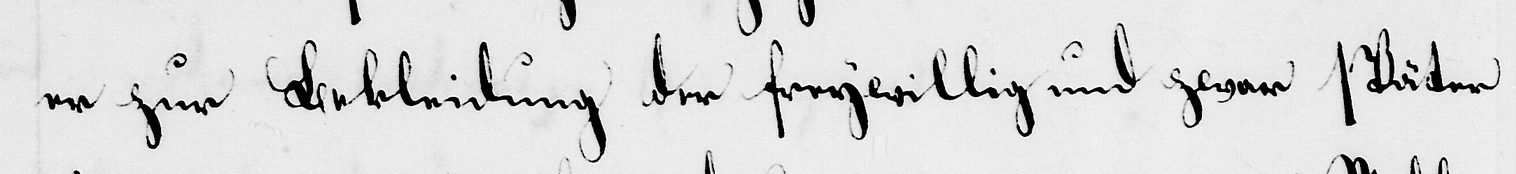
ers zur Bekleidung der freywillig und zwar später
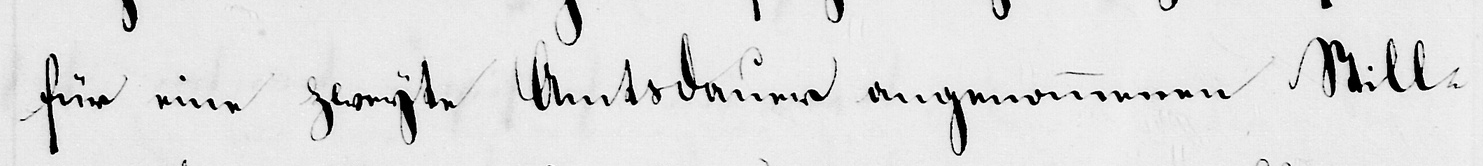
für eine zweyte Amtsdauer angenommenen Still¬
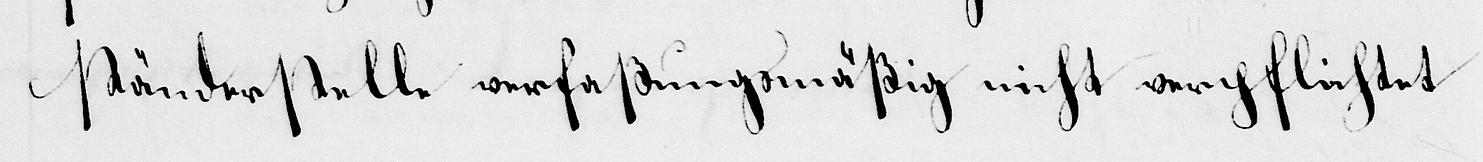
ständerstelle verfaßungsmäßig nicht verpflichtet
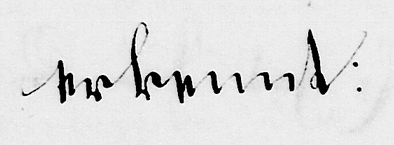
erkannt:
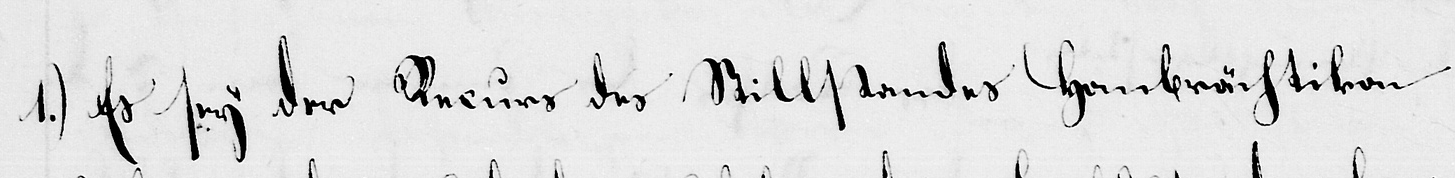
1.) Es sey der Recurs des Stillstandes Hombrächtikon
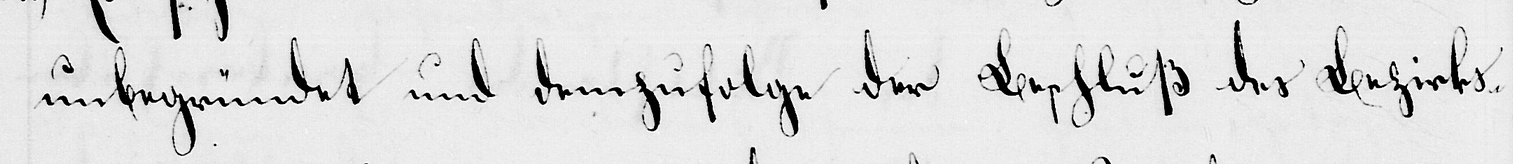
unbegründet und demzufolge der Beschluß des Bezirks¬
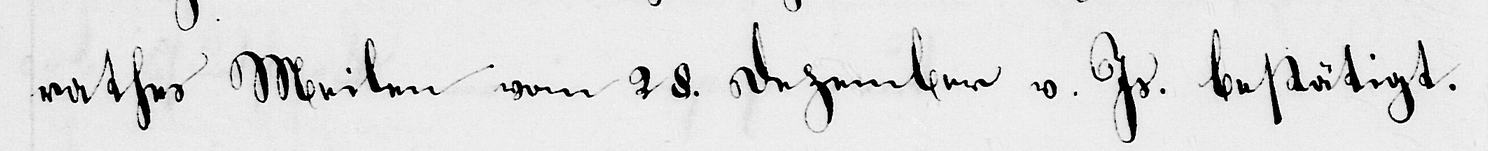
rathes Meilen vom 28. Dezember v. Js. bestätigt.
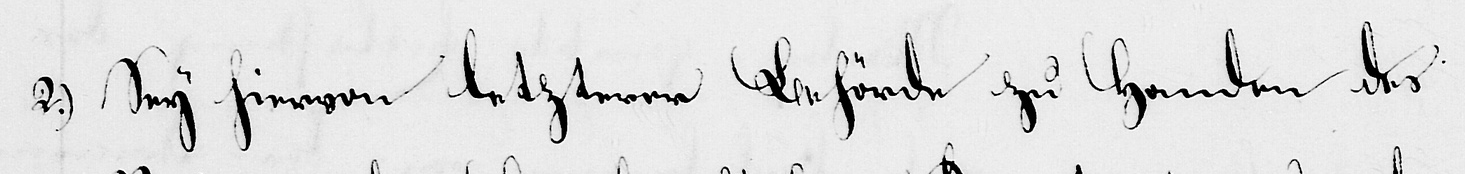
2.) Sey hiervon letzterer Behörde zu Handen des
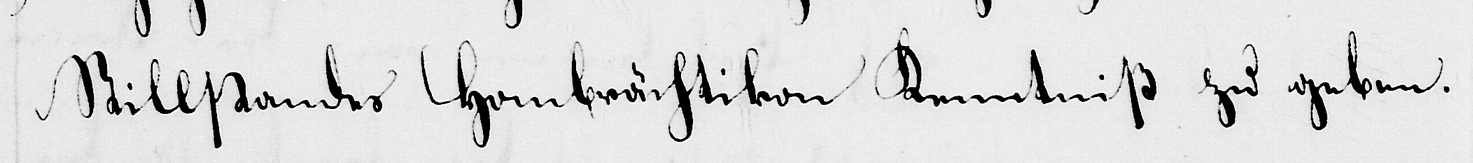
Stillstandes Hombrächtikon Kenntniß zu geben.
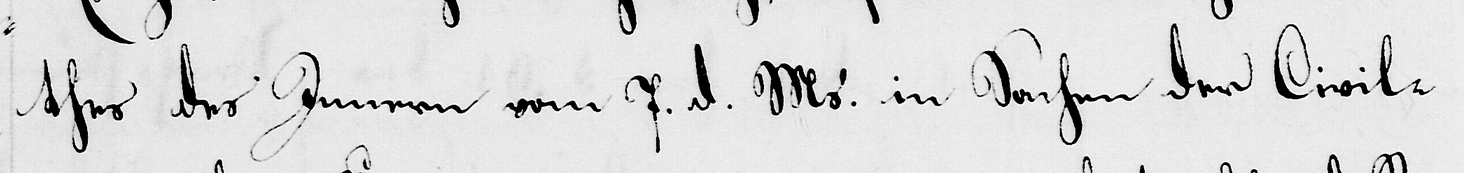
thes des Innern vom 7. d. Ms. in Sachen der Civil¬
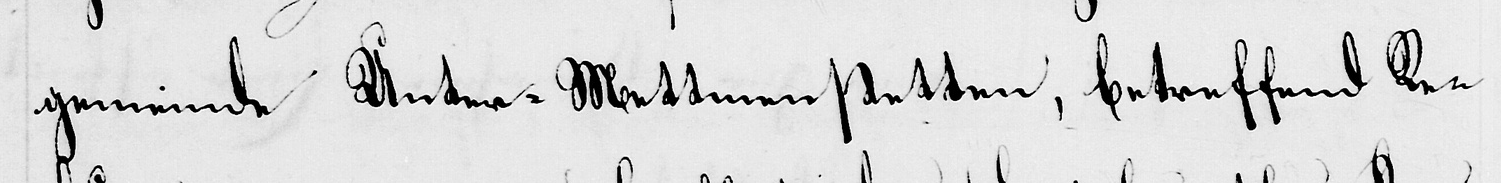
gemeinde Unter-Mettmenstetten, betreffend Re¬
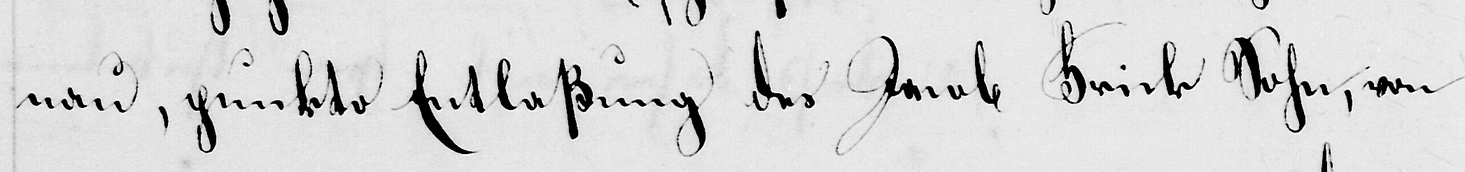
nau, punkto Entlaßung des Jacob Frick Sohn, von
